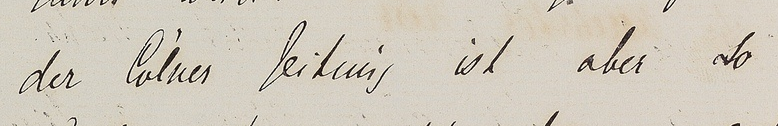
der Cölner Zeitung ist aber so
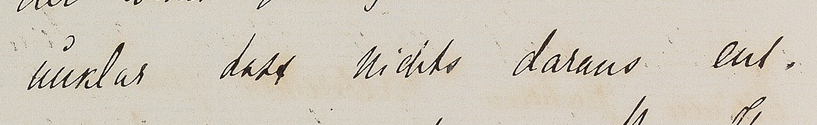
unklar dass nichts daraus ent-
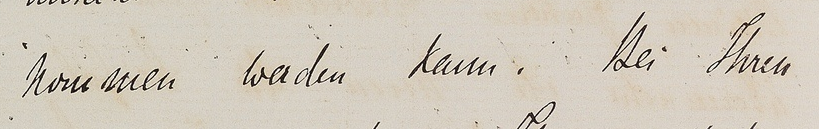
nommen werden kann. Bei Ihren
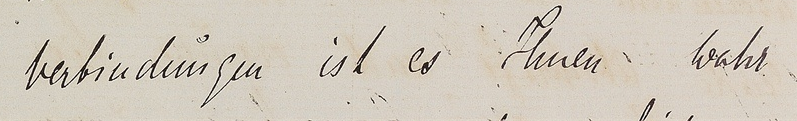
Verbindungen ist es Ihnen wahr-
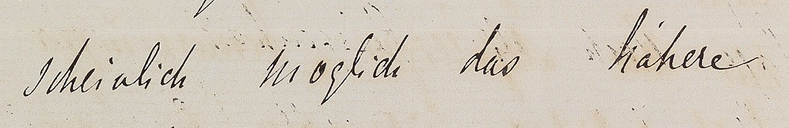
scheinlich möglich das Nähere
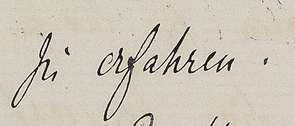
zu erfahren.
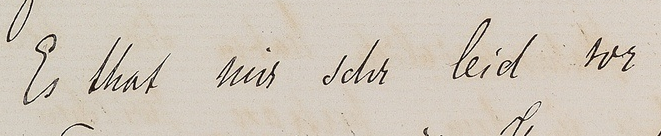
Es that mir sehr leid vor
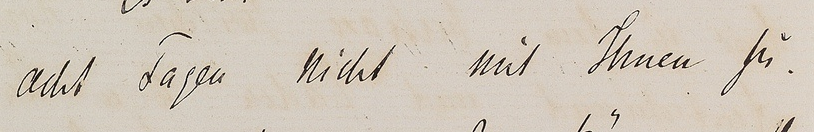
acht Tagen nicht mit Ihnen zu-
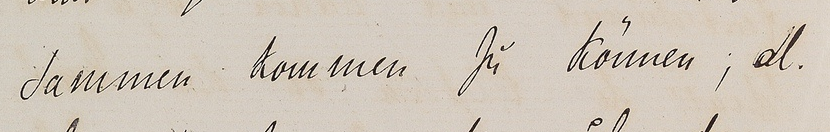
sammen kommen zu können, al-
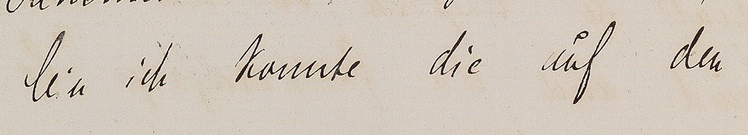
lein ich konnte die auf den
